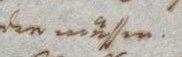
den müssen.
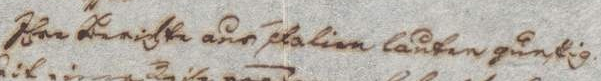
Ihre Berichte aus Italien lauten günstig.
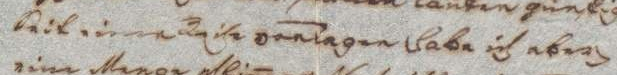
Seit einer Reihe von Tagen habe ich aber
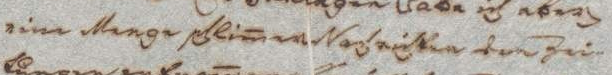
eine Menge schlimmer Nachrichten den Zei-
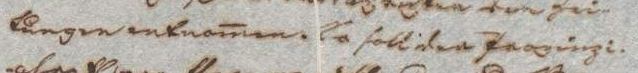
tungen entnommen. So soll der Provinzi-
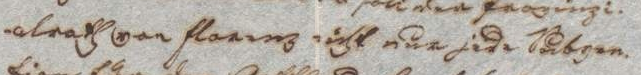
alrath von Florenz nicht nur jede Subven-
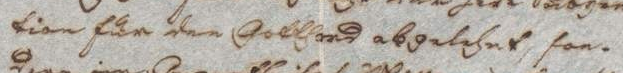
tion für den Gotthard abgelehnt, son-
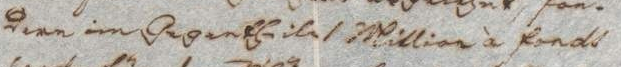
dern im Gegentheile 1 Million à fonds
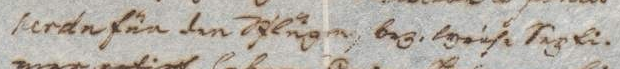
perdu für den Splügen, bez.weise Septi-
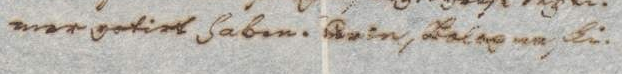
mer votirt haben. Turin, Bologna, Li-
